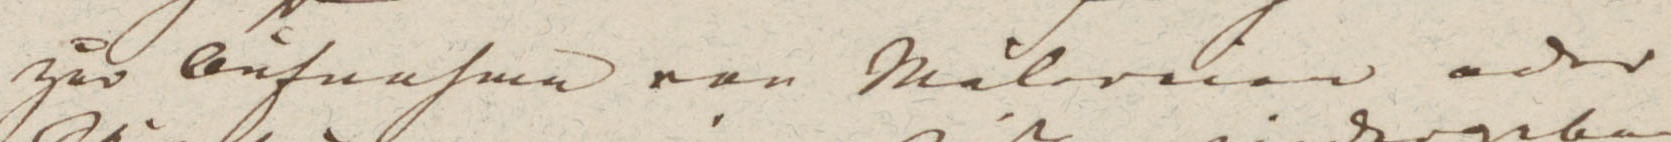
zur Aufnahme von Malereien oder
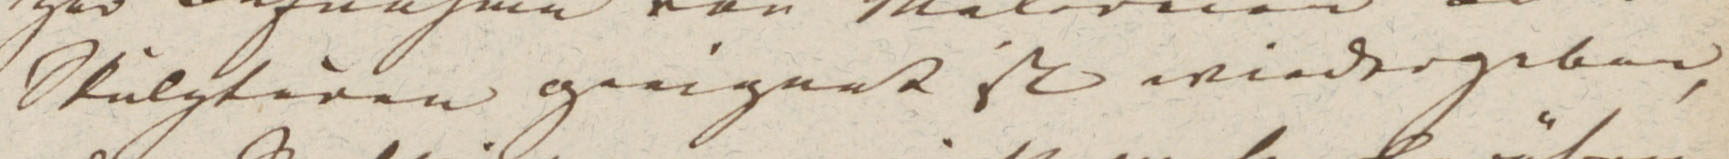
Skulpturen geeignet ist wiedergeben,
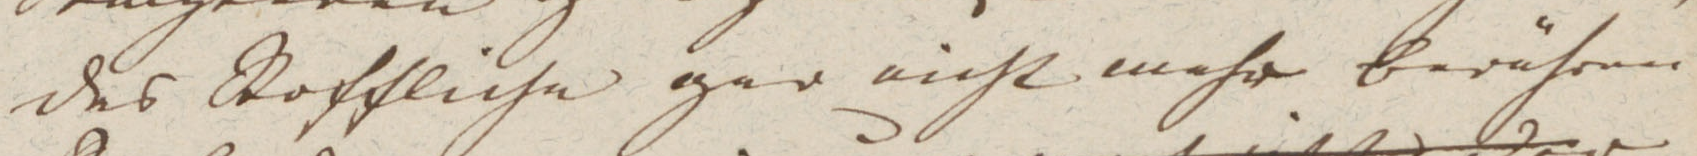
das Stoffliche gar nicht mehr berühren
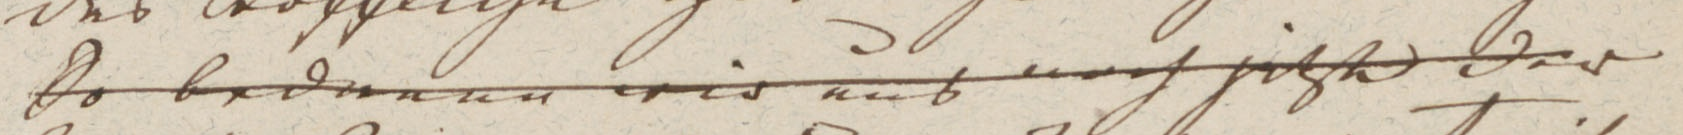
So bedienen wir uns noch jetzt der
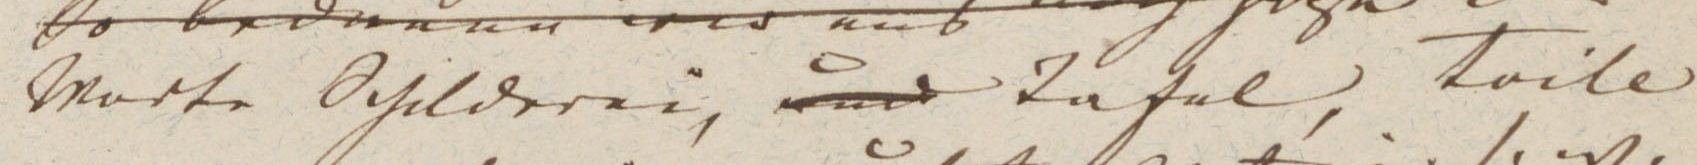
Worte Schilderei, und Tafel, toile
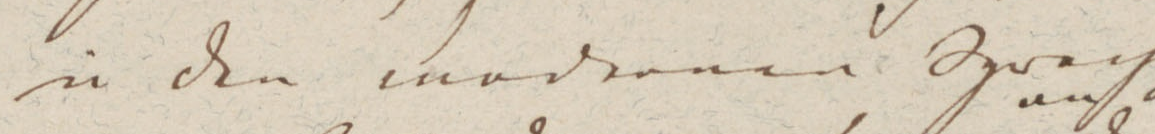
in den modernen Sprachen
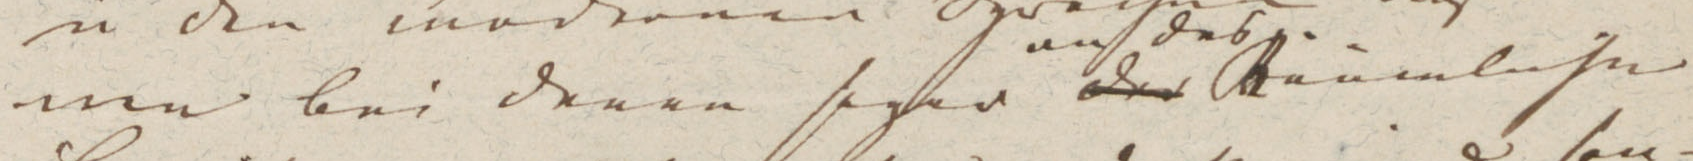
nen bei denen sogar der an das rRäumliche
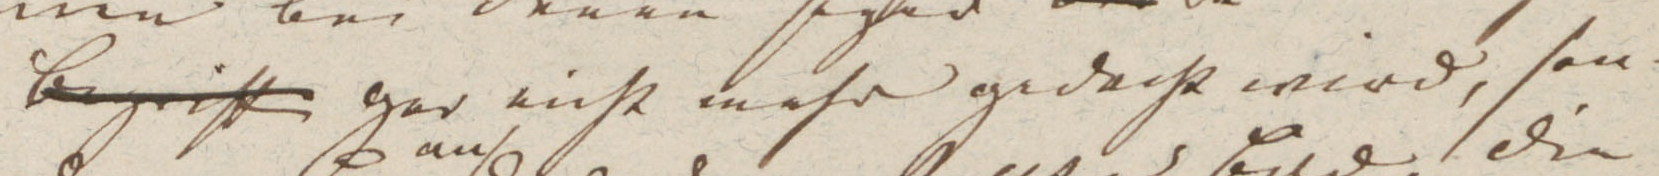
Begriff gar nicht mehr gedacht wird, son-
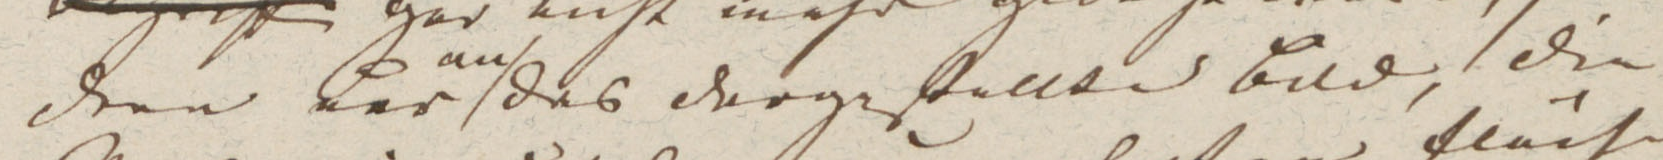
dern nur an das dargestellte Bild, die
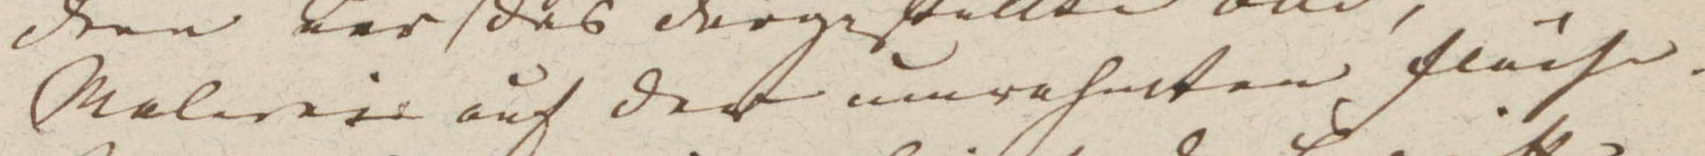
Malerei auf der umrahmten Fläche.
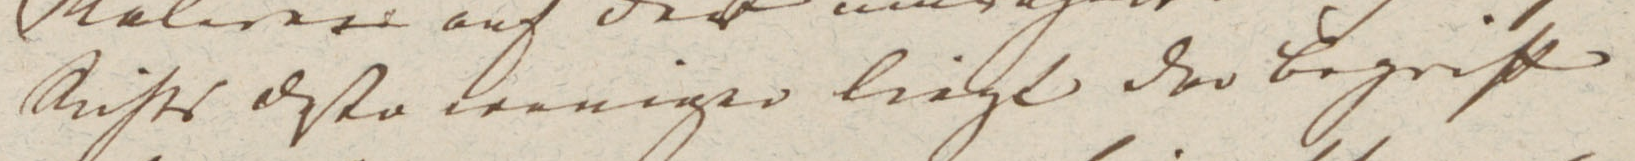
Nichts desto weniger liegt der Begriff
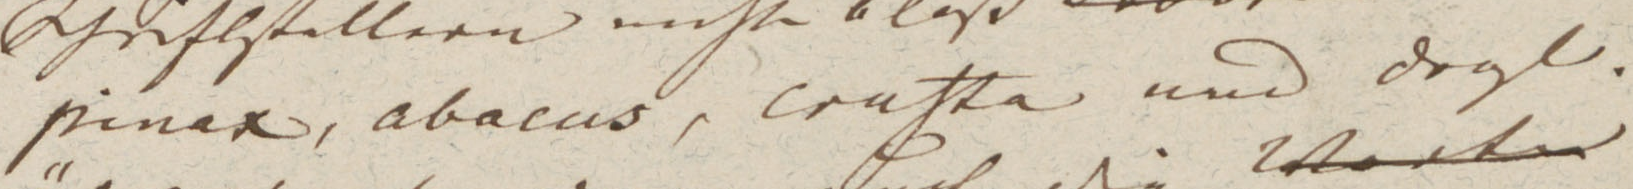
pinax, abacus, crusta und degl.
